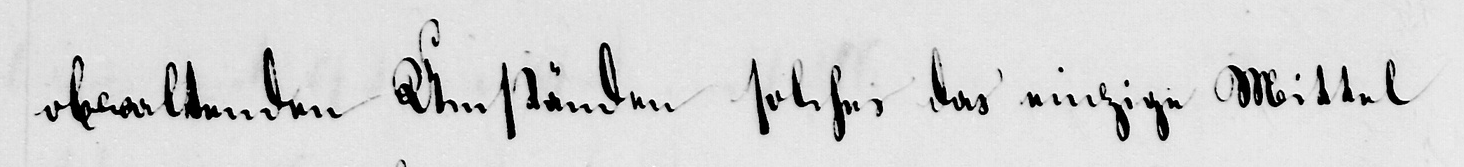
obwaltenden Umständen solches das einzige Mittel
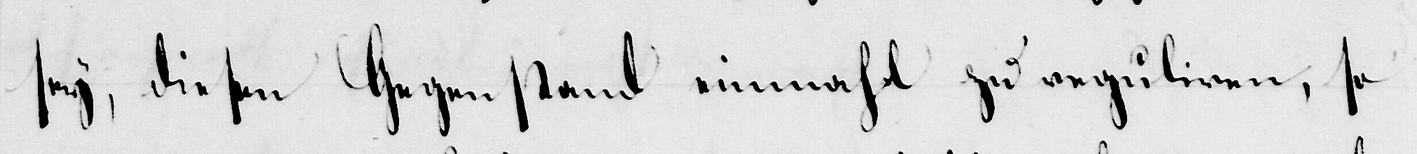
sey, diesen Gegenstand einmahl zu reguliren, so
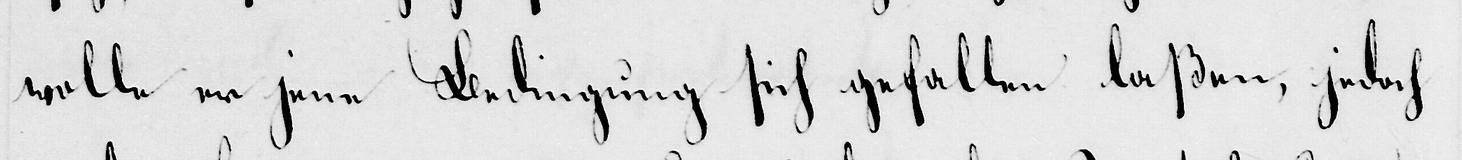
wolle er jene Bedingung sich gefallen laßen, jedoch
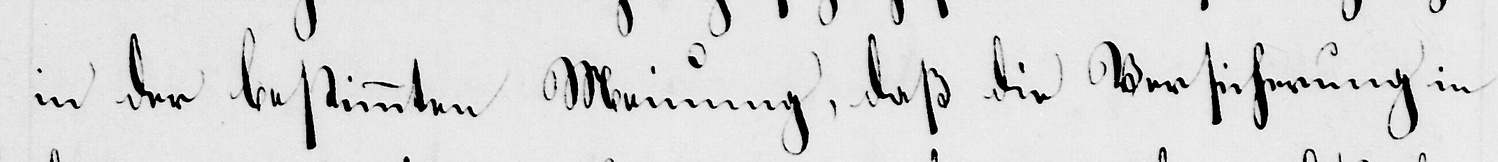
in der bestimmten Meinung, daß die Versicherung in
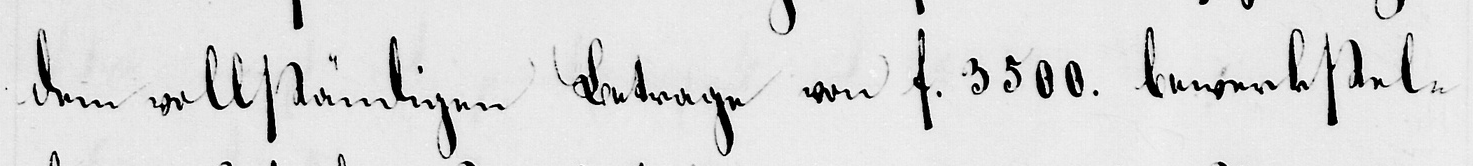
dem vollständigen Betrage von f. 3500. bewerkstel¬
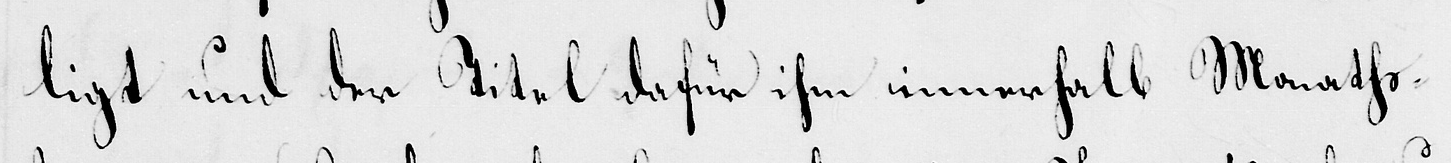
ligt und der Titel dafür ihm innerhalb Monaths¬
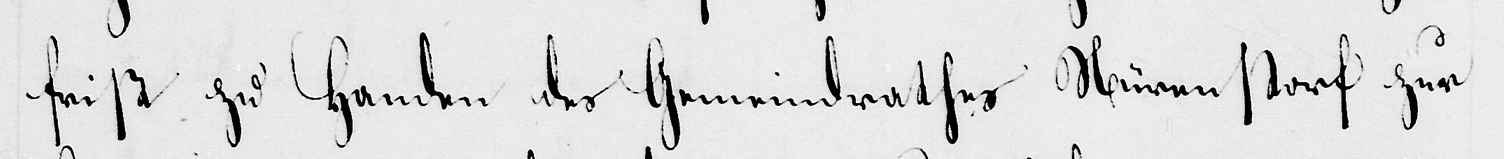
frist zu Handen des Gemeindrathes Nürensdorf zur
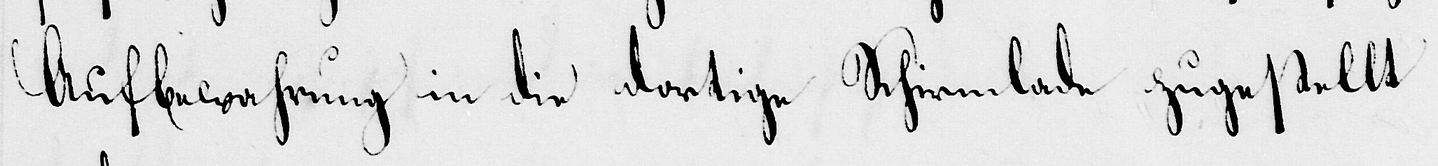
Aufbewahrung in die dortige Schirmlade zugestellt
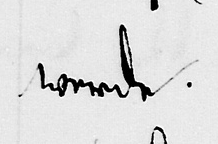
werde.
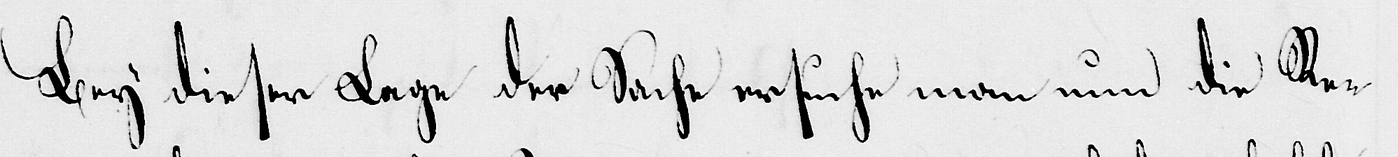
Bey dieser Lage der Sache ersuche man nun die Re¬
